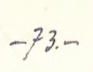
73
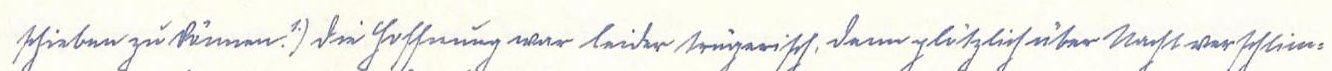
schieben zu können.1) Die Hoffnung war leider trügerisch, denn plötzlich über Nacht verschlim-
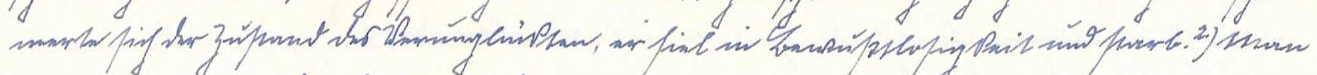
merte sich der Zustand des Verunglückten, er fiel in Bewußtlosigkeit und starb.2) Man
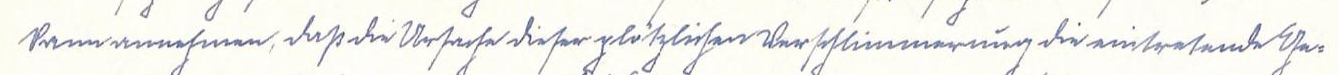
kann annehmen, daß die Ursache dieser plötzlichen Verschlimmerung die eintretende Ge
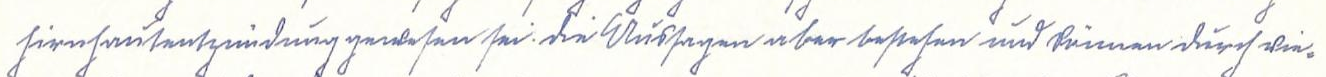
hirnhautentzündung gewesen sei. Die Aussagen aber bestehen und können durch vie-
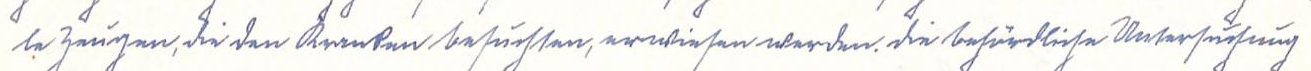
le Zeugen, die den Kranken besuchten erwiesen werden. Die behördliche Untersuchung
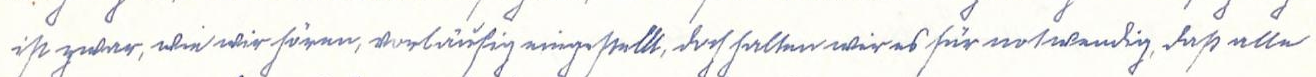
ist zwar, wie wir hören, vorläufig eingestellt, doch halten wir es für notwendig, daß alle
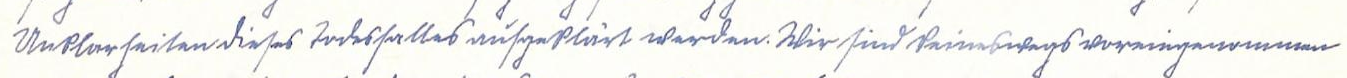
Unklarheiten dieses Todesfalles aufgeklärt werden. Wir sind keineswegs voreingenommen
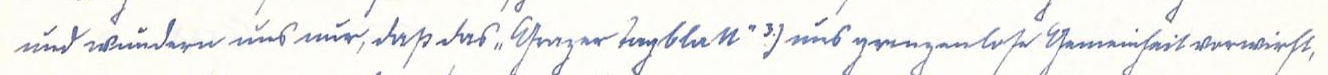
und wundern uns nur, dass das Grazer Tagblatt 3) uns grenzenlose Gemeinheit vorwirft,
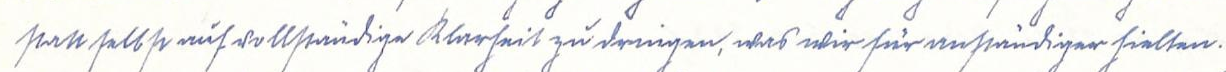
statt selbst auf die vollständige Klarheit zu bringen, was wir anständiger hielten.
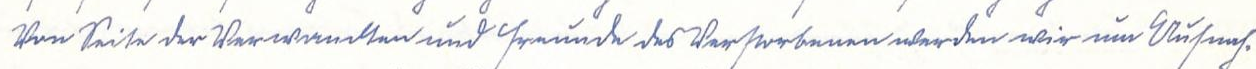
Von Seite der Verwandten und Freunde des Verstorbenen werden wir um Aufnah-
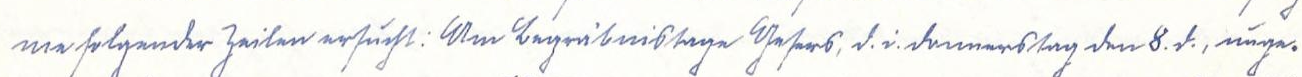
me folgende Zeilen gesucht: Am Begräbnistage Gesers, d. i. Donnerstag den 8. d., unge-
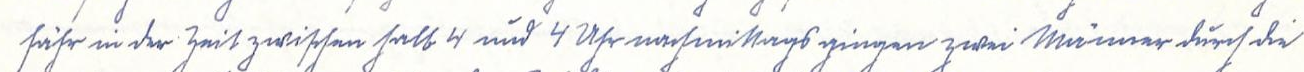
fähr in der Zeit zwischen halb 4 und 4 Uhr nachmittags gingen zwei Männer durch die
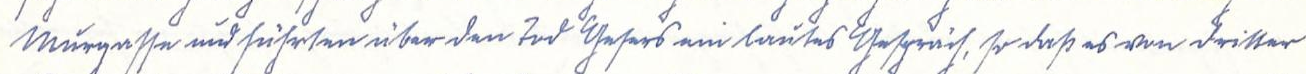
Gasse und führten über den Tod Gesers ein lautes Gespräch, so daß es von dritter
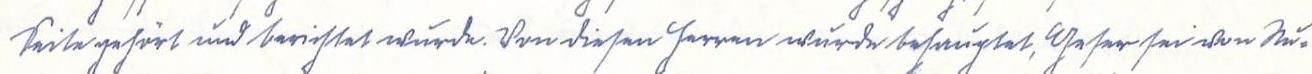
Seite gehört und berichtet wurde. Von diesem Herrn wurde behauptet, Geser sei von Stu-
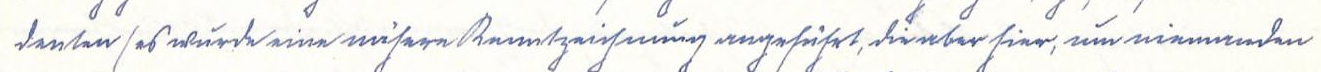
denten (es wurde eine nähere Kennzeichnung eingeführt, die aber hier, um niemanden
